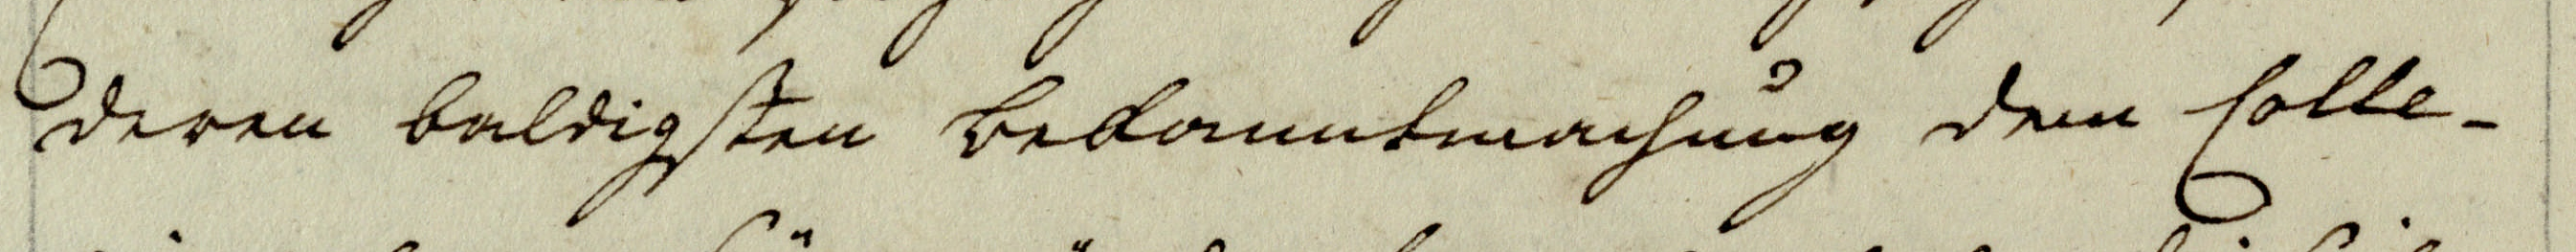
deren baldigsten Bekanntmachung dem Colle¬
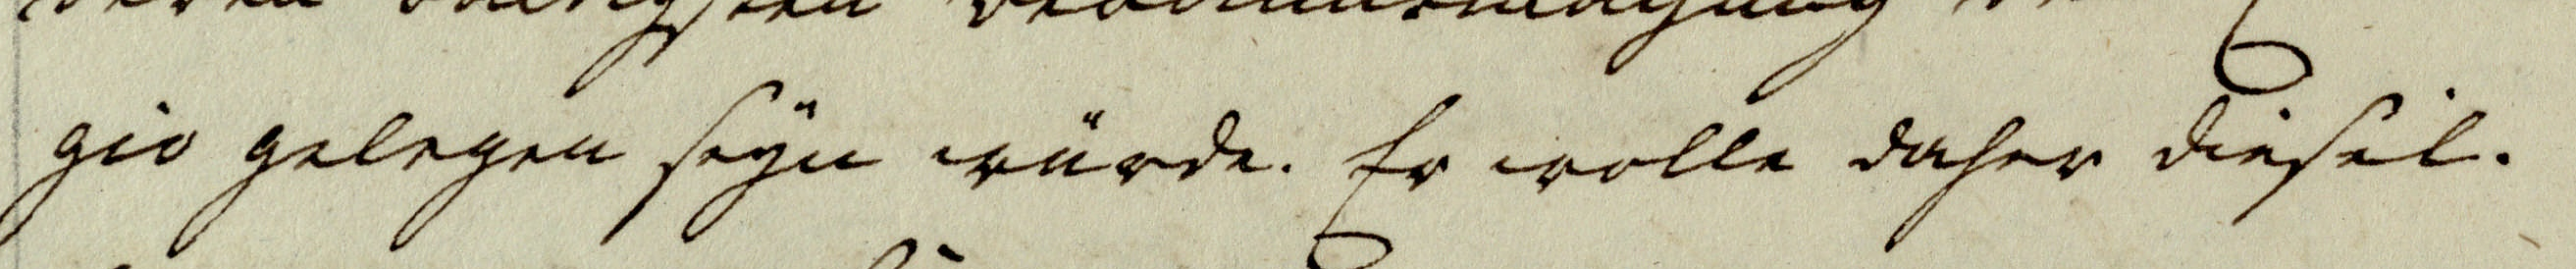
gio gelegen seÿn würde. Er wolle daher diesel¬
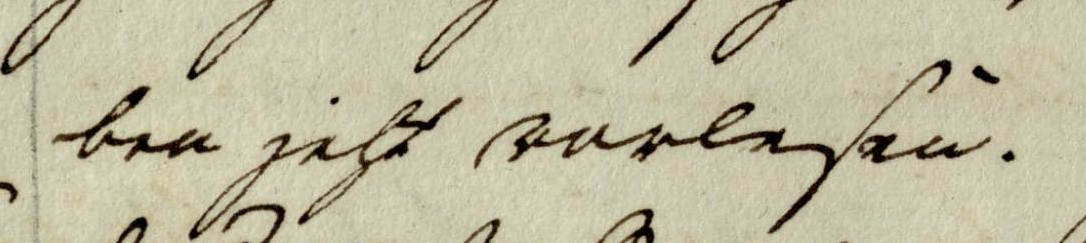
ben jetzt vorlesen.
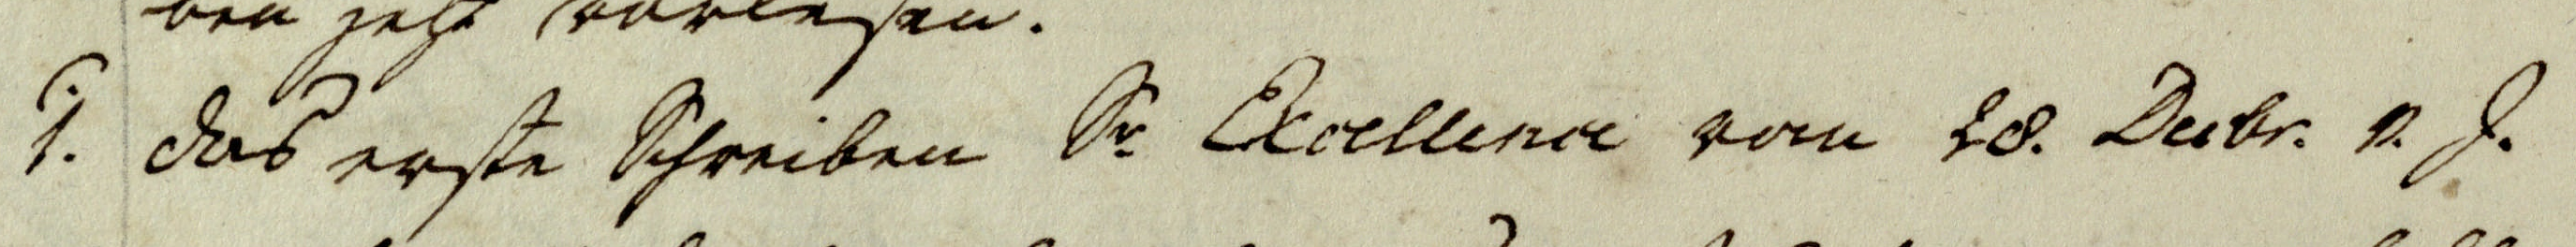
1. Das erste Schreiben Sr Excellence vom 28. Decbr. v. J.
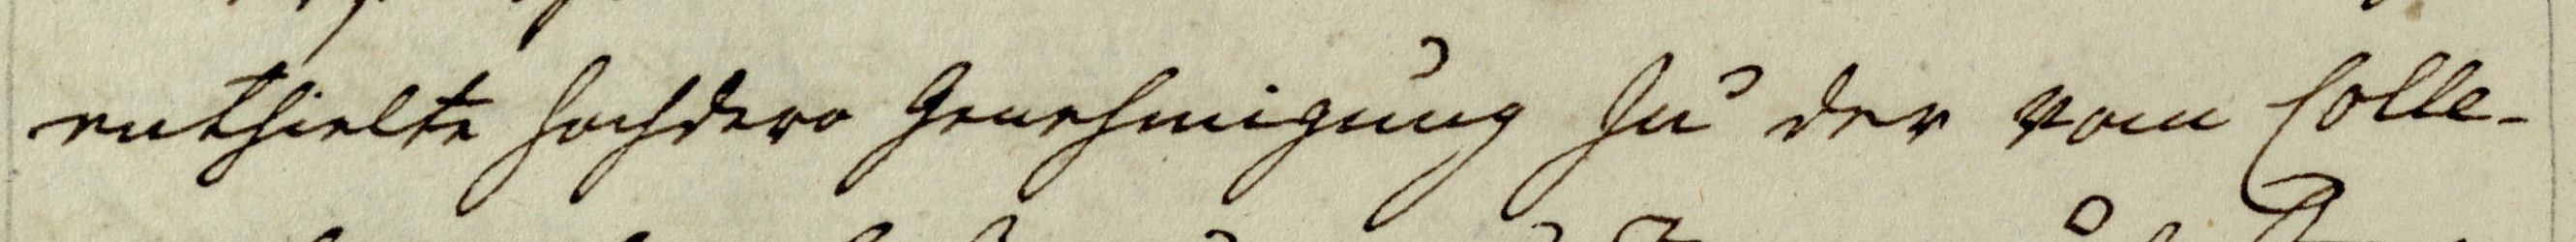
enthielte hochdero Genehmigung zu der vom Colle¬
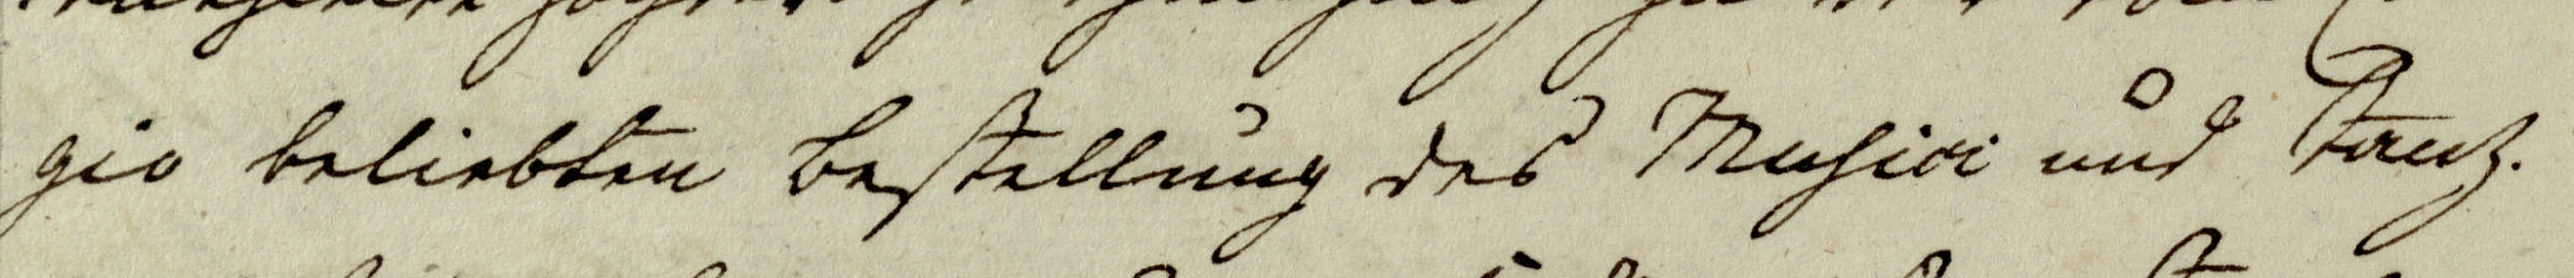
gio beliebten Bestellung des Musici und Tanz¬
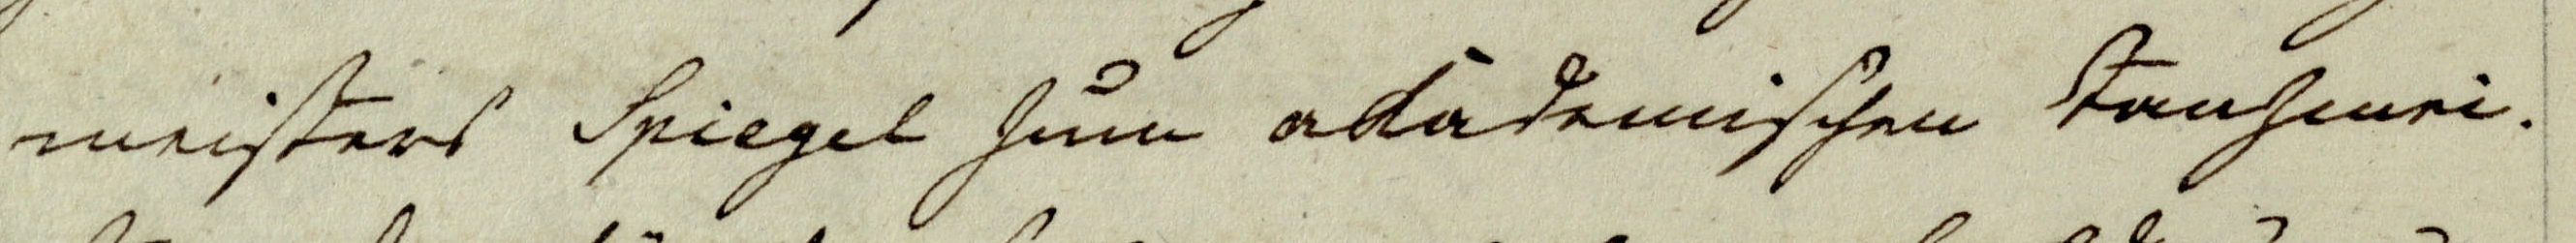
meistens Spiegel zum akademischen Tanzmei¬
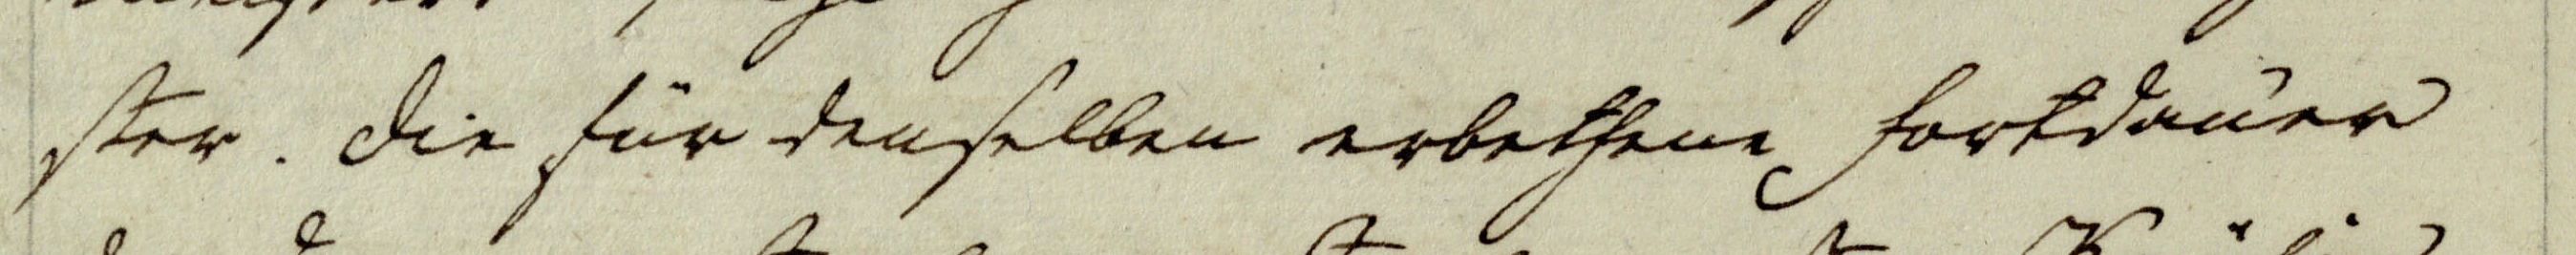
ster. Die für denselben erbethene Fortdauer
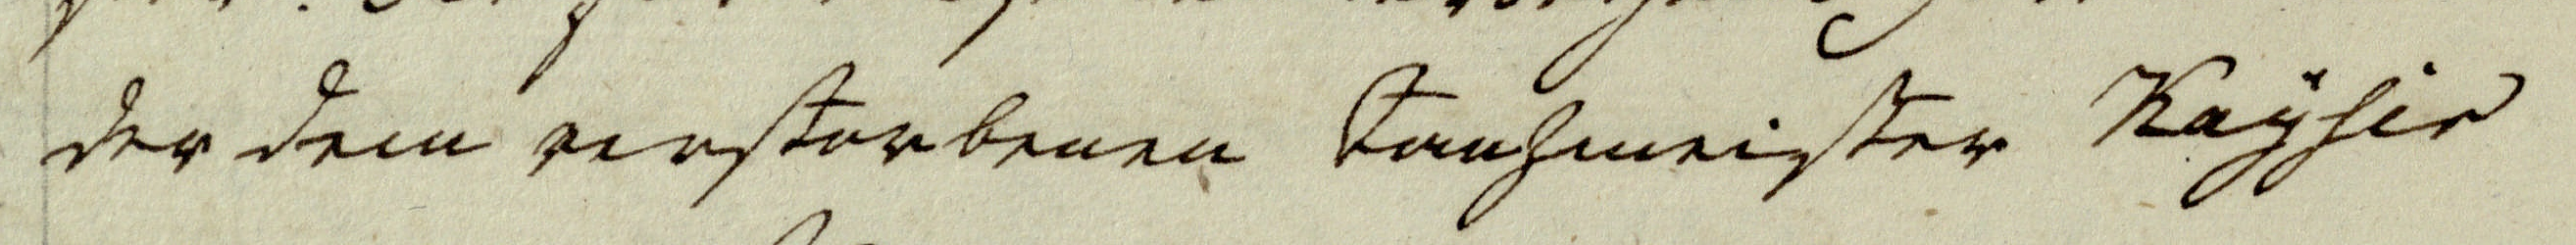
der dem verstorbenen Tanzmeister Kaÿser
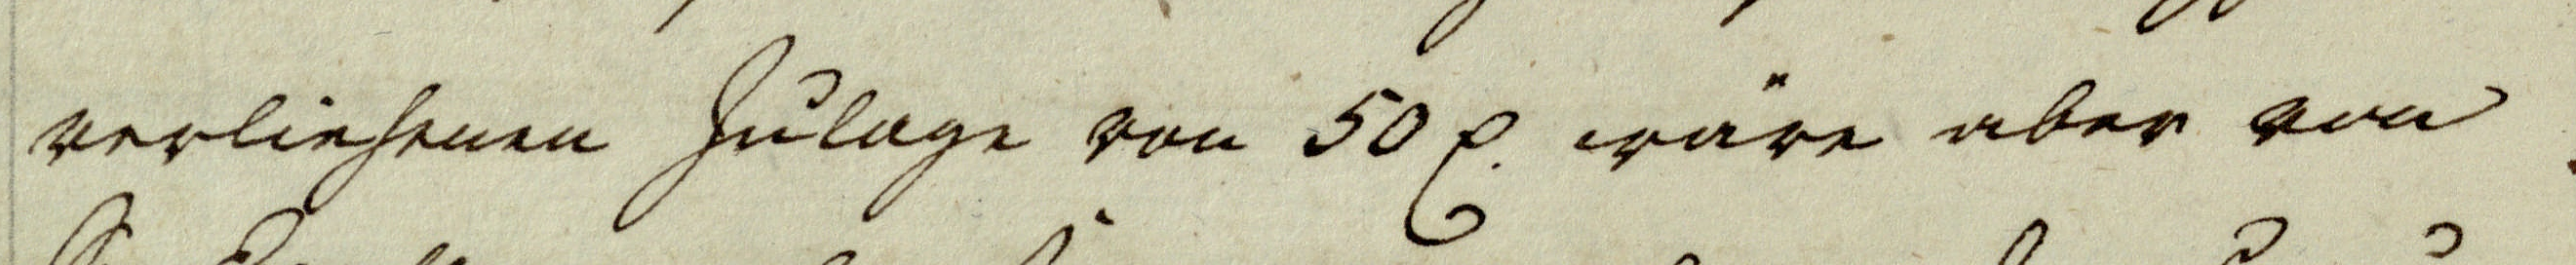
verliehenen Zulage von 50 l. wäre aber von
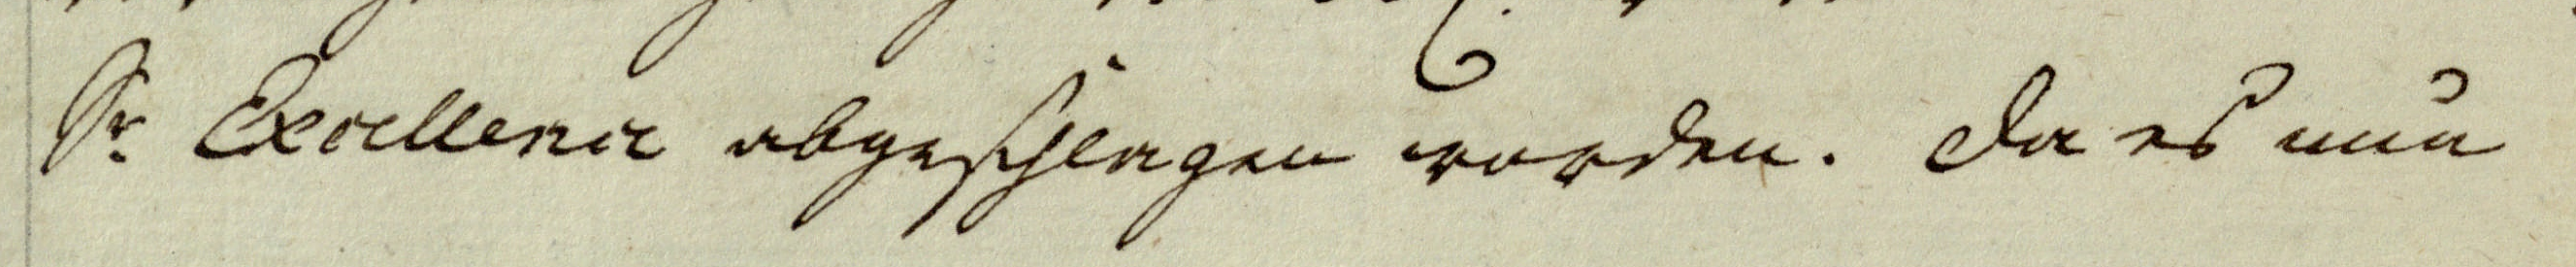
Sr Excellence abgeschlagen worden. Da es nun
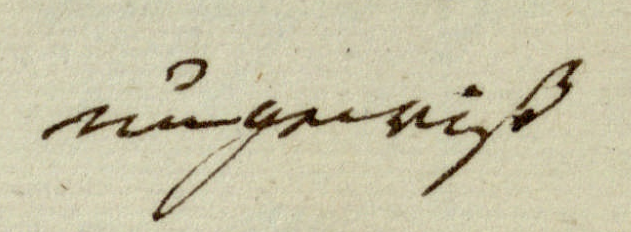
ungewiß
